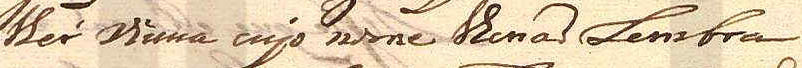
lher viuua cujo nome lhe naõ Lembra
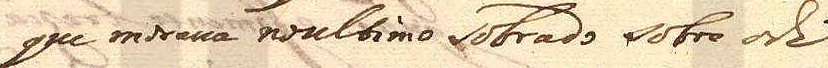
que moraua no ultimo sobrado sobre o di
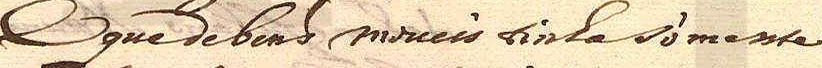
E que de beñs moueis tinha sómente
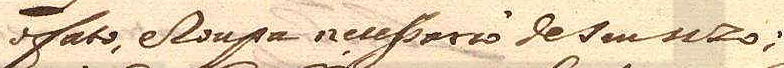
o fato, e Roupa neçessario de seu uzo;
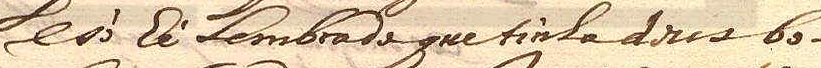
e só hé Lembrado que tinha dous bo
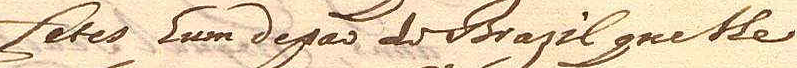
fetes hum de pao do Brazil que lhe
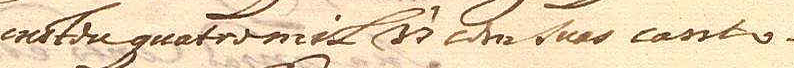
custou quatro mil rs̄ com suas canto
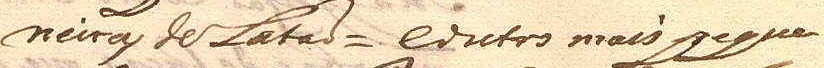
neiras de Lataõ = e outro mais peque
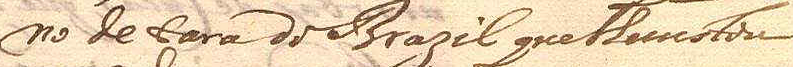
no de tara do Brazil que lhe custou
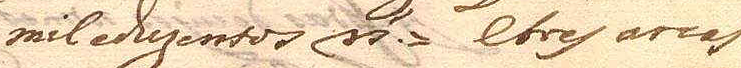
mil e duzentos rs̄ = E tres arcas
